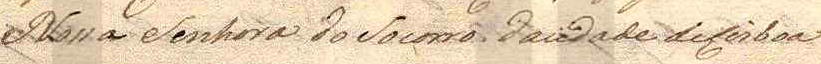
Nossa Senhora do Socorro da cidade de Lisboa
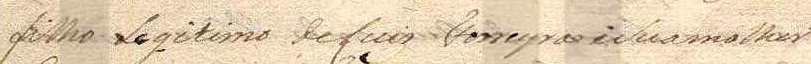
filho legitimo de Luiz Ferreyra e sua molher
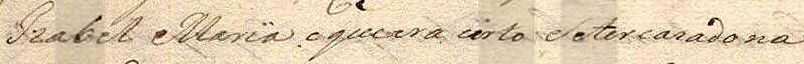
Izabel Maria e que era certo se ter cazado na
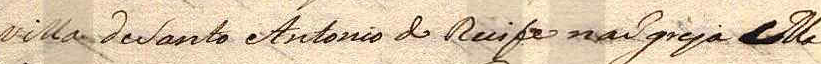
villa de Santo Antonio do Recife na Igreja Ma
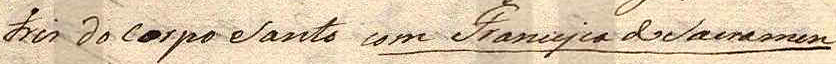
tris do corpo santo com Francisca do sacramen
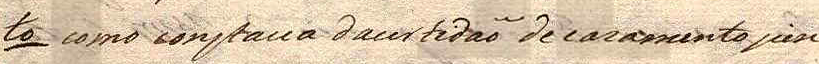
to como constaua da certidaõ de cazamento jun
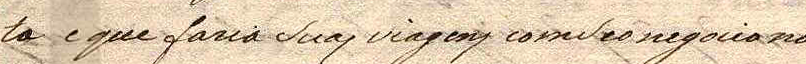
ta e que fazia suas viagens com seo negocio no
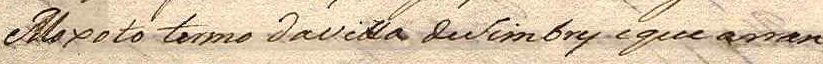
Moxoto termo da villa de simbres e que arran
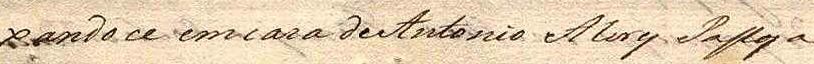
xandoce em caza de Antonio Alvres Passos a
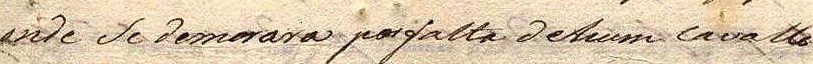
onde se demorara por falta de hum cavallo
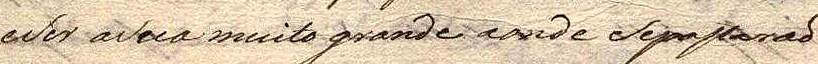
e ser a seca muito grande aonde se passarão
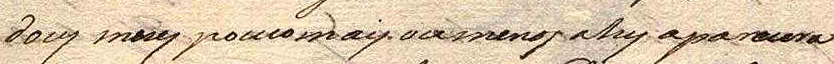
dous mezes pouco mais ou menos ahy aparecera
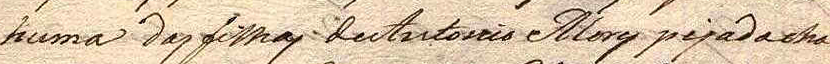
huma das filhas de Antonio Alvres pejada cha
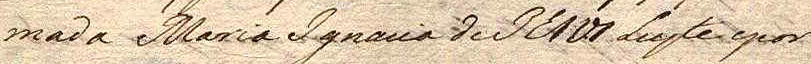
mada Maria Ignacia de IESUS Leyte e por
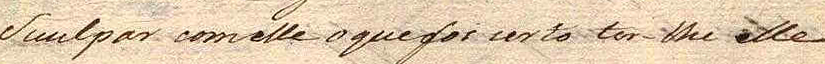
se culpar com elle e que foi certo ter-lhe elle
